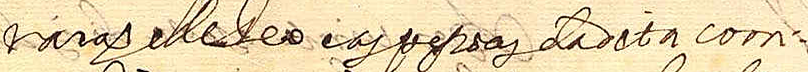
raraõ elle Reo e as pessoas da dita com
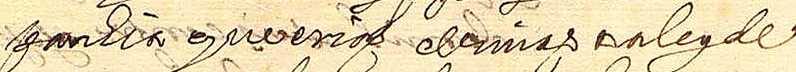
panhia que criaõ e viuiaõ na ley de
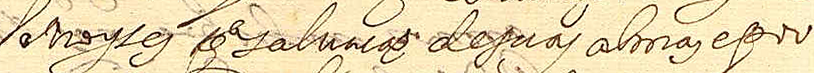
Moyses pa saluaçaõ de suas almas e por
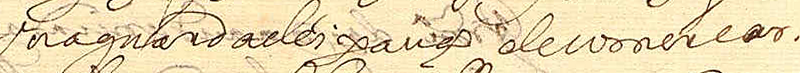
sua guarda deixauaõ de comer car
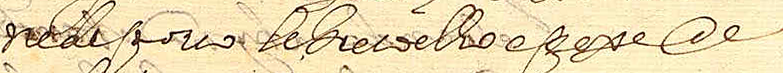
ne de porco lebre coelho e pexe de
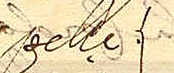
pelle?
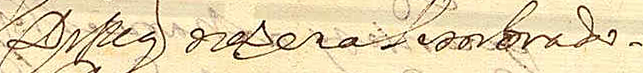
Disse q̄ naõ era Lembrado.
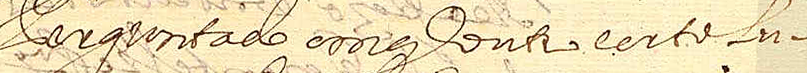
Perguntado em q̄ outro certo Lu
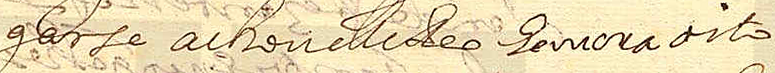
gar se achou elle Reo hauera oito
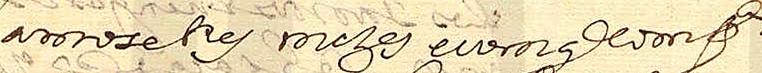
annos e tres mezes e com q̄ compa
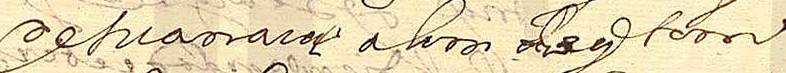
de sua nacaõ alem do q̄ tem
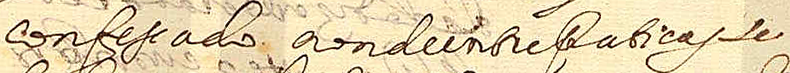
confessado aonde entre praticas se
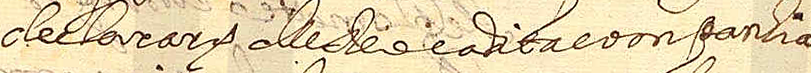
declararaõ elle Reo e a dita companhia
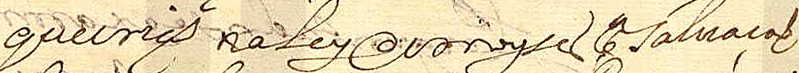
que criaõ na Ley de moyses pa saluaçaõ
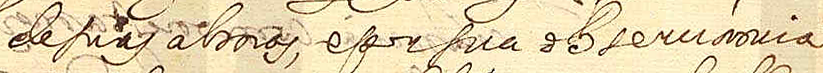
de suas almas, e por sua obseruancia
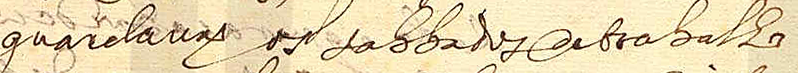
guardauaõ os sabbados de trabalho
